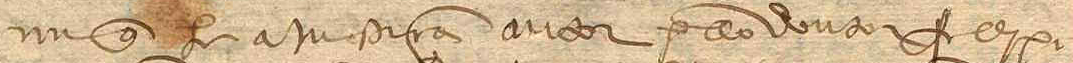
em q̄ he a Justiça autor p̄llo doutor felljpe
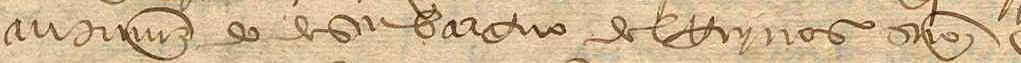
antunez do desenbarguo del Rey noso snōr e
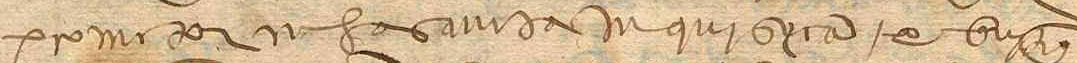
prometor en ha samta Jnqujsycā / e brytiz
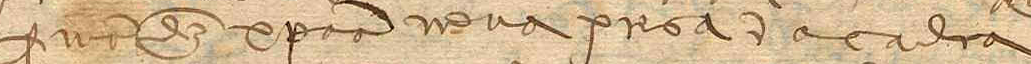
fernādez xpaā noua presa ē a cadea
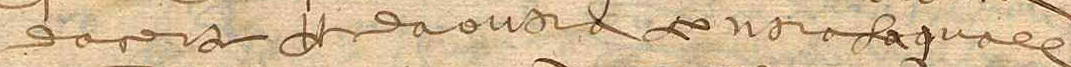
da corte Re da outra contra ha quall
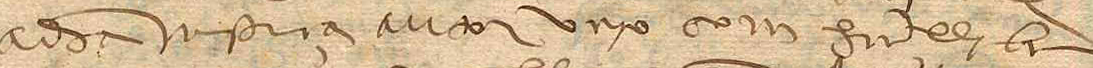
a dt̄a Justiça autor veyo com hū lljbe
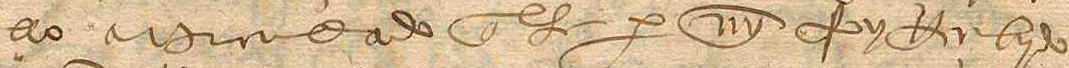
llo articullado q̄ lhe ꝑ mȳ foy Reçebydo
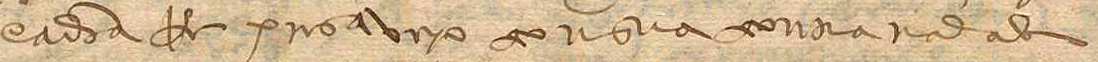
e a dt̄a Re presa veyo con sua contrariadade
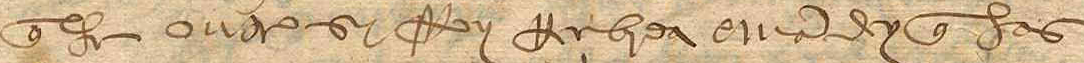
q̄ lhe outrosy ffoy Reçebjda e mādey q̄ has
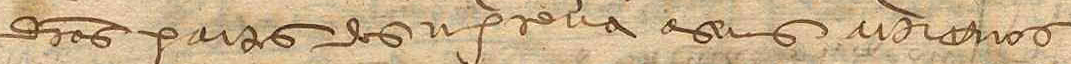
dt̄as partes desen proua a seus artiguos
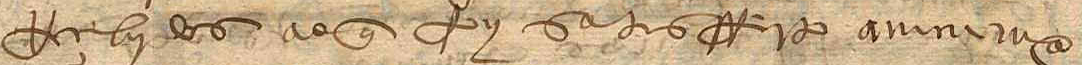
Reçebydos ao q̄ foy satisffejto a meu mā
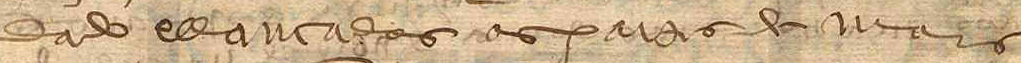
dado e llancadas as partes de mais
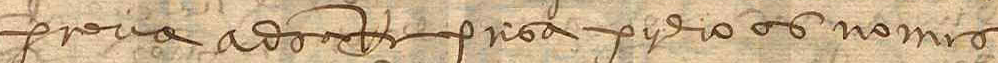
proua a dt̄a Re presa pydio os nomes
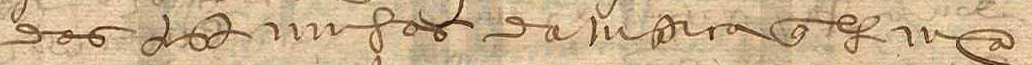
das testemuhas da justica q̄ lhe mā
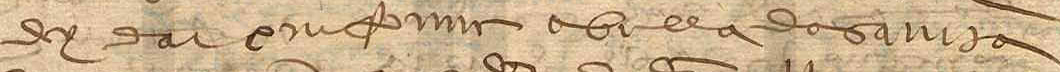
dey dar conforme a bulla da samta
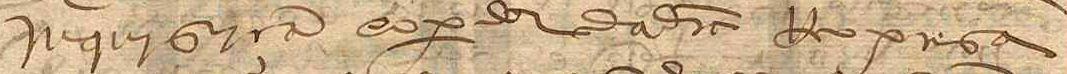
Jnqujsyçā e o ꝑdor da dt̄a Re presa
